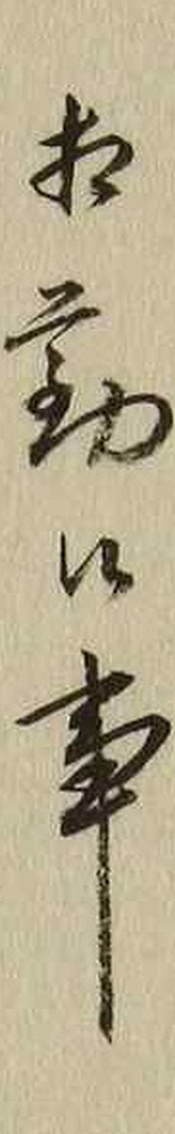相勤候事
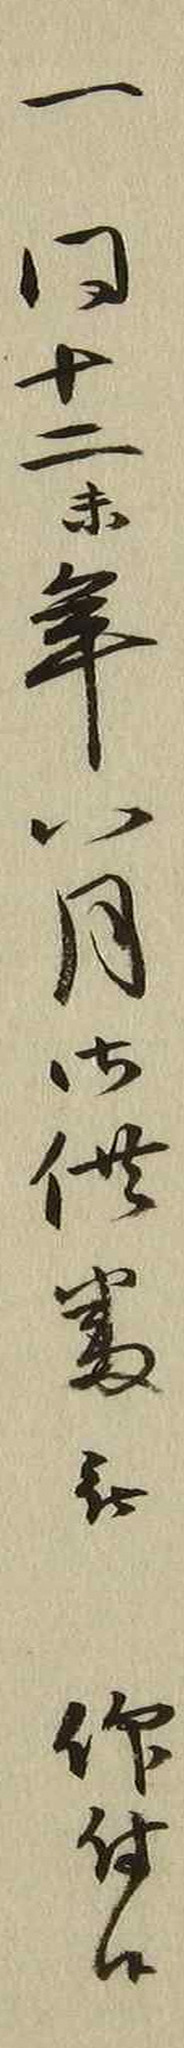一同十二未年八月御供番被仰付候
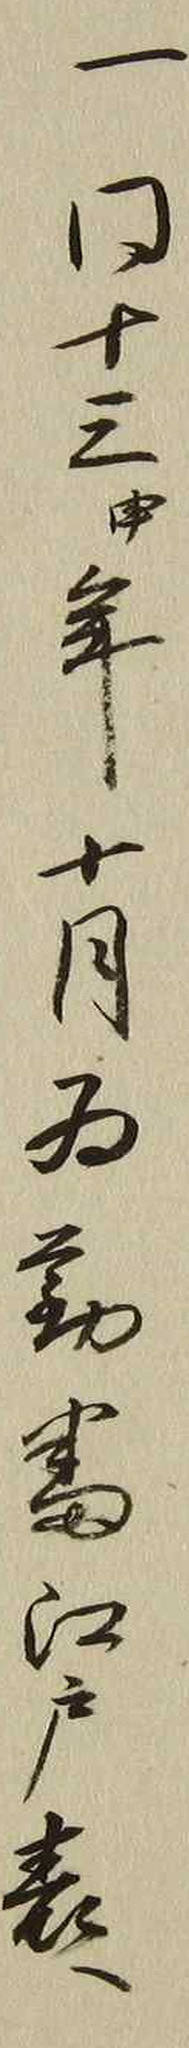一同十三申年十月為勤番江戸表へ
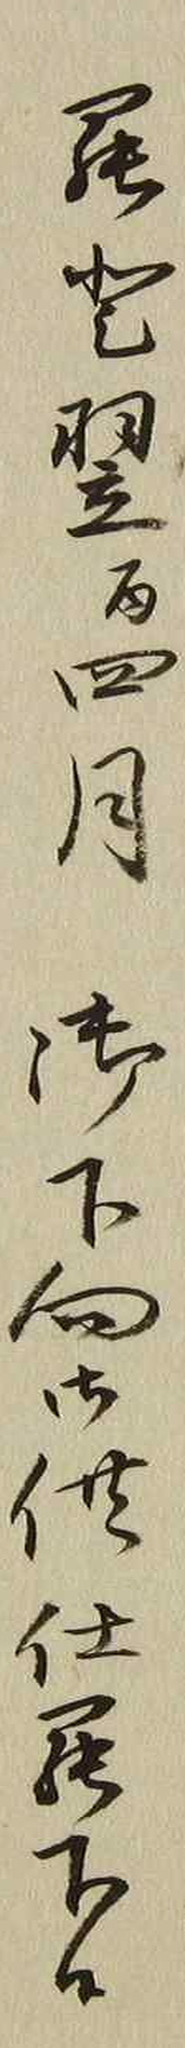罷登翌酉四月御下向御供仕罷下候
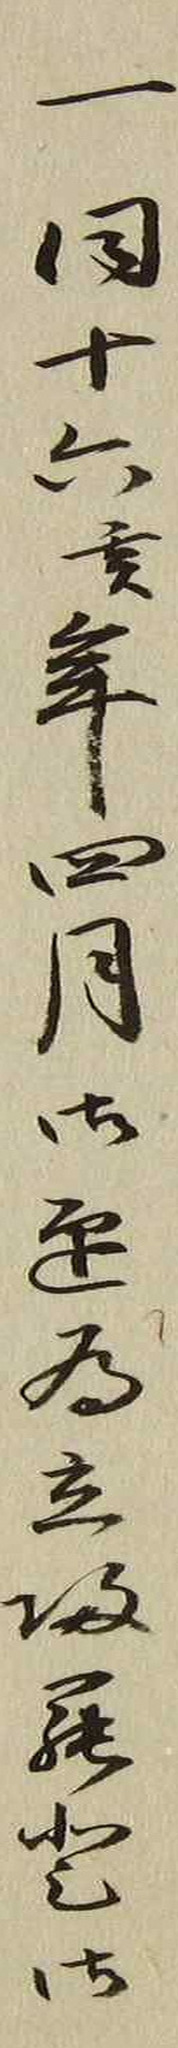一同十六亥年四月御迎為立帰罷登御
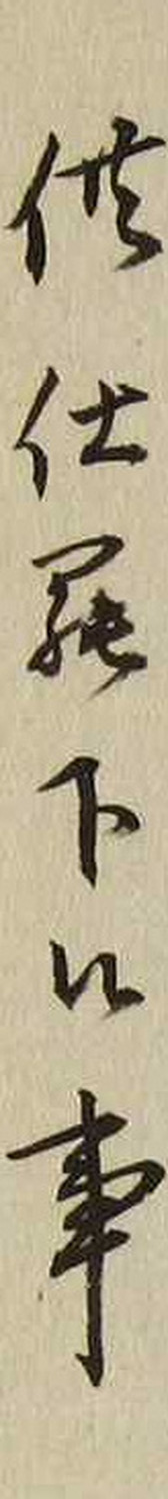供仕罷下候事
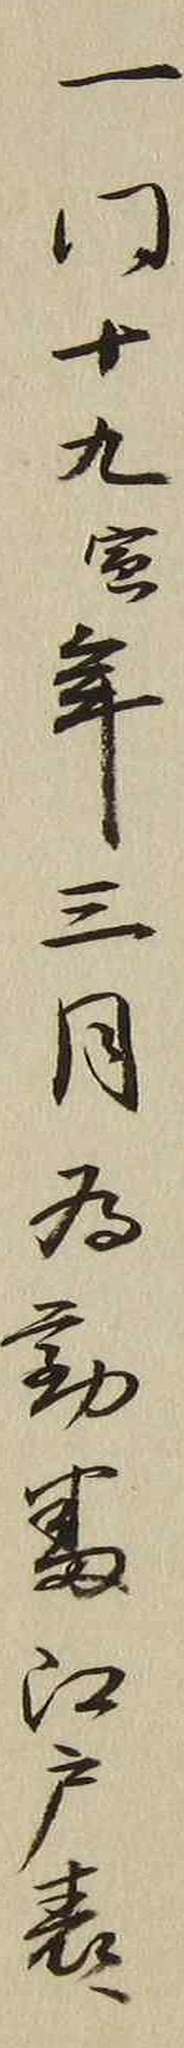一同十九寅年三月為勤番江戸表へ
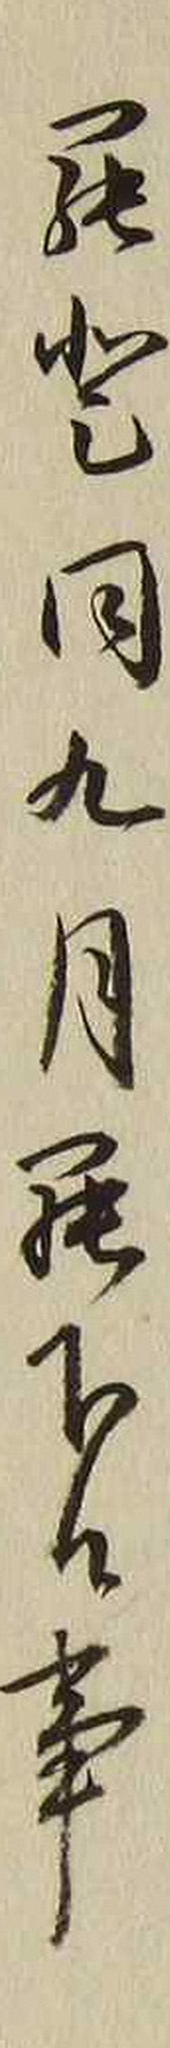罷登同九月罷下候事
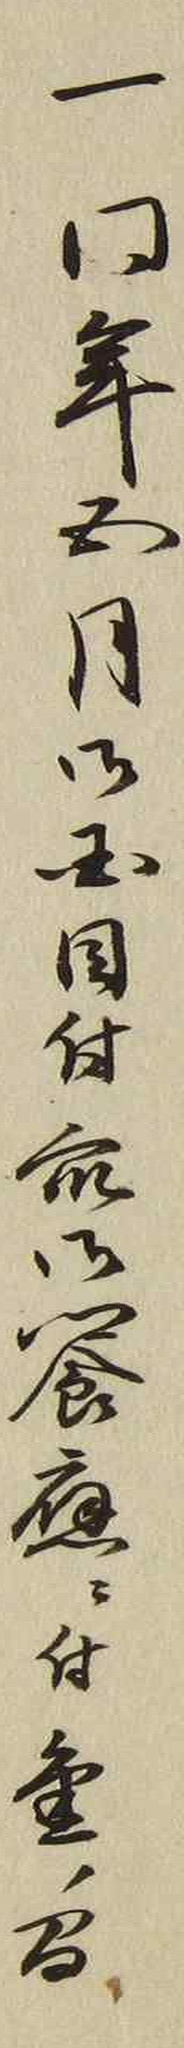一同年五月御国目付衆御饗応ニ付金ノ間
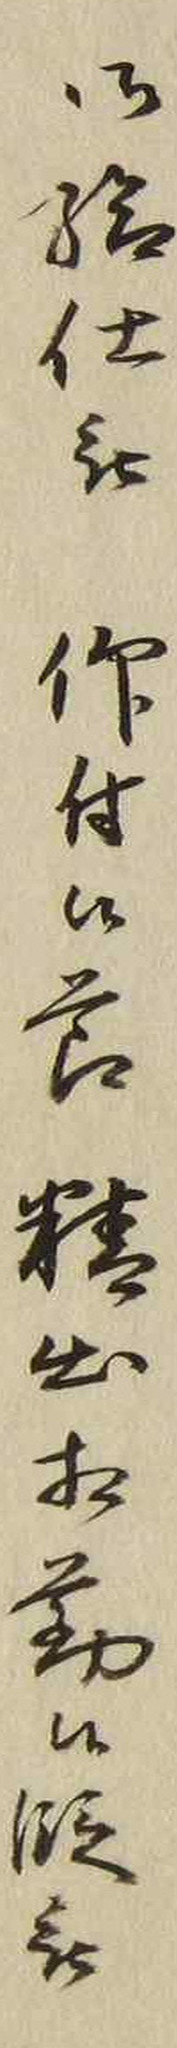御給仕被仰付候節精出相勤候段被

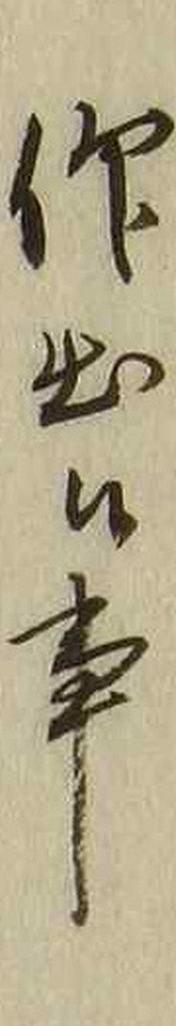仰出候事
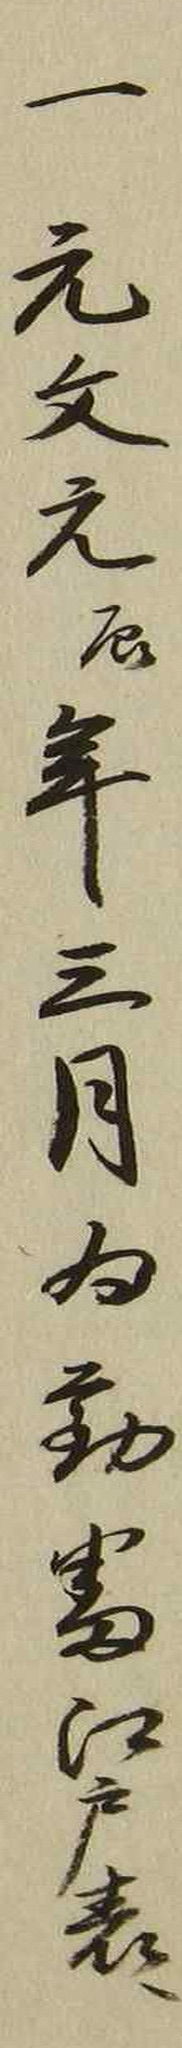一元文元辰年三月為勤番江戸表へ
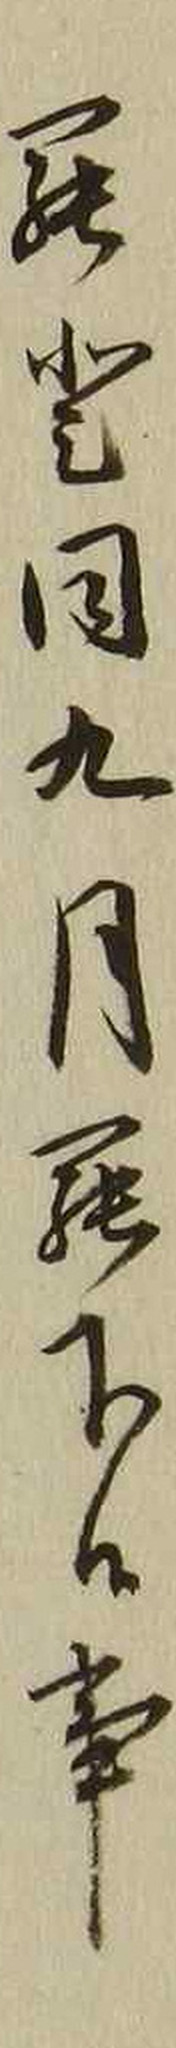罷登同九月罷下候事
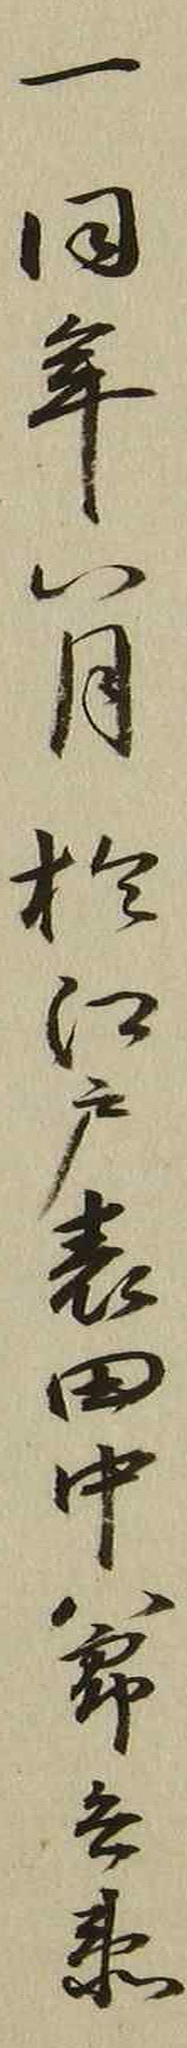一同年八月於江戸表田中八郎兵衛
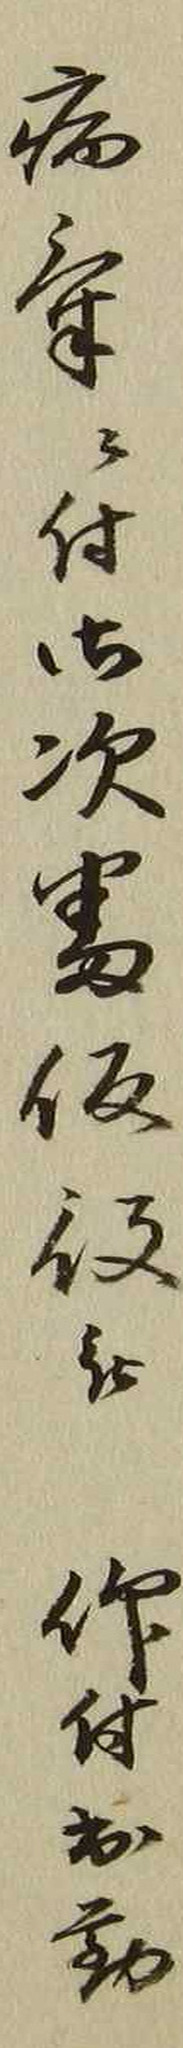病気ニ付御次番仮役被仰付出勤
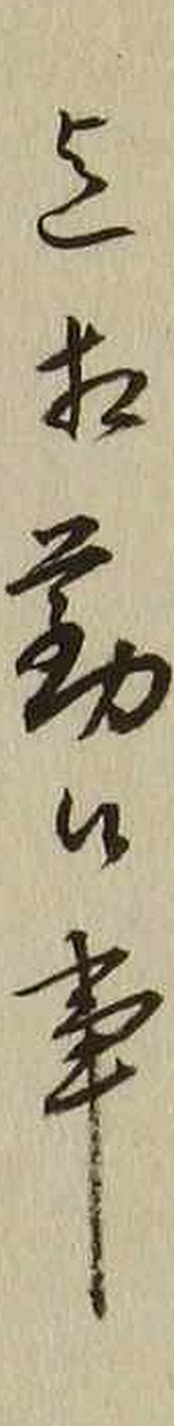迄相勤候事
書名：諸士系譜　巻之128　た之部4
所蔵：会津若松市立会津図書館
